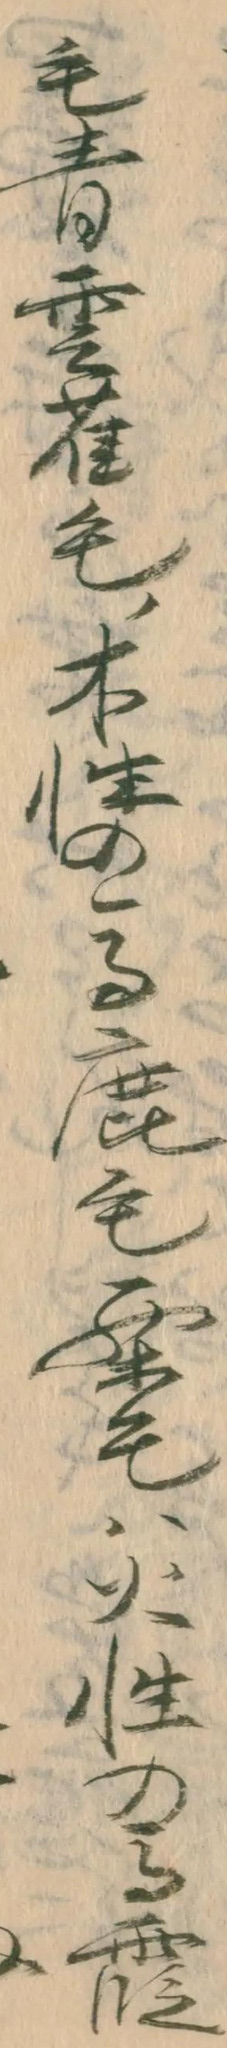毛青雲毛の木性の馬鹿毛栗毛は火性の馬霞
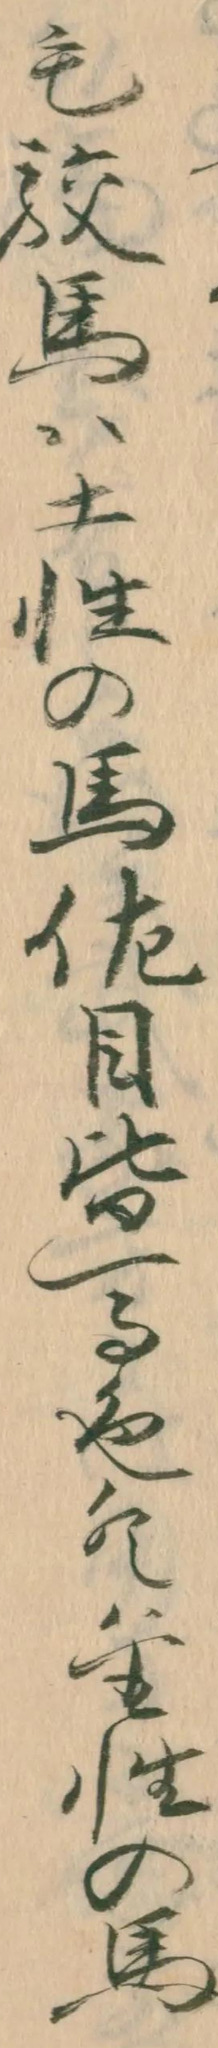毛絞馬は土性の馬佐目皆馬色歟金性の馬
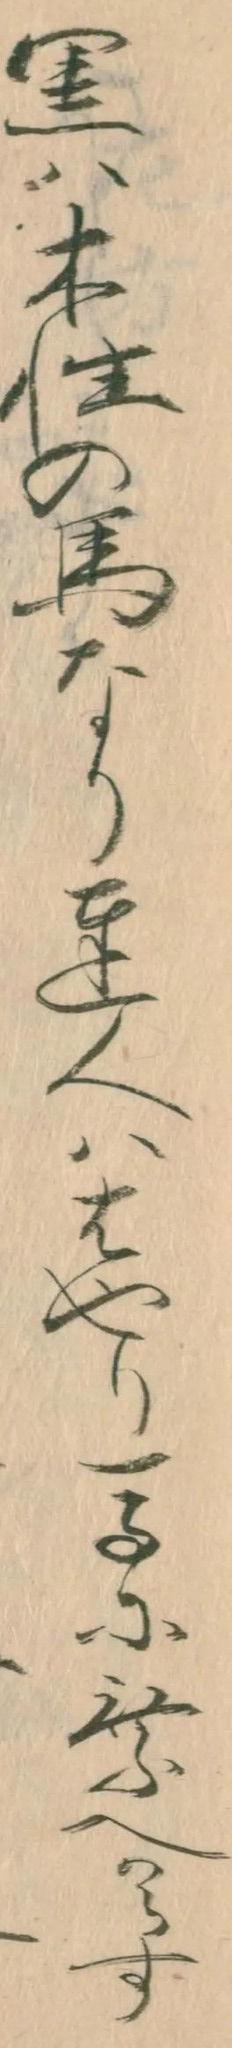黒は木性の馬なり達人ははやり馬に乗へからす
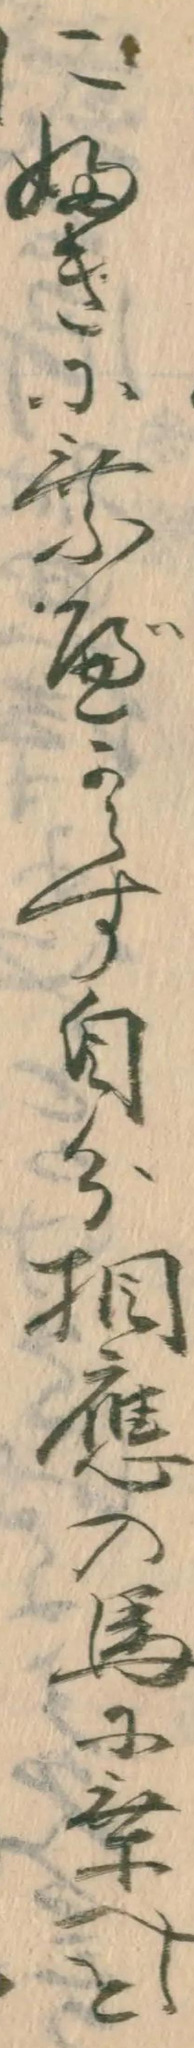にふきに乗べからす自分相応の馬に乗へしと
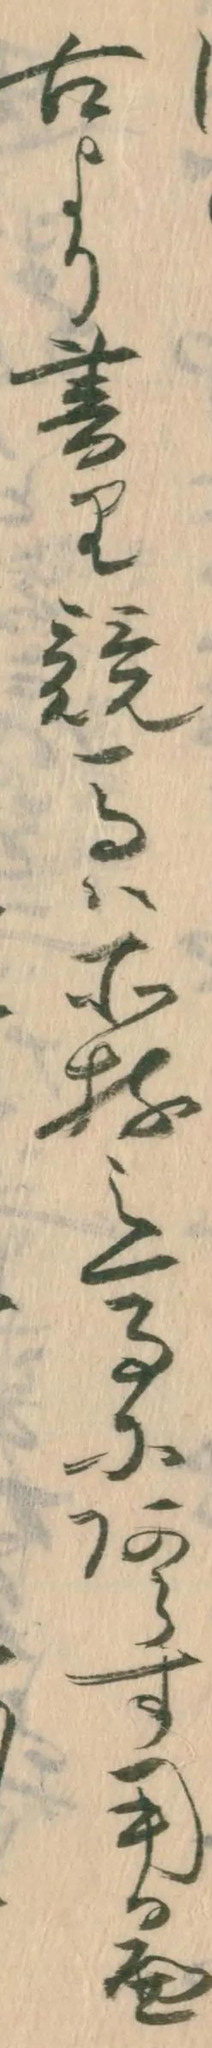古より書り競馬は所持之馬にあらす用るへ
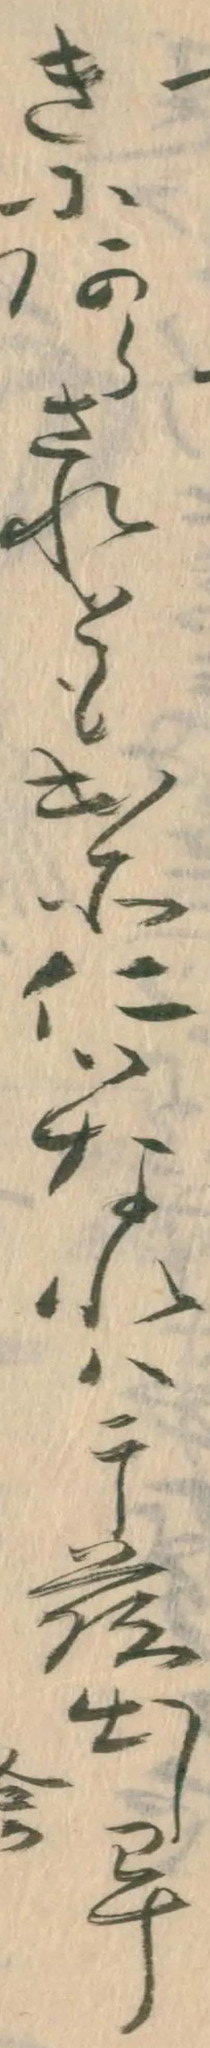きにあらされとも出所にはなれは于茲出し畢
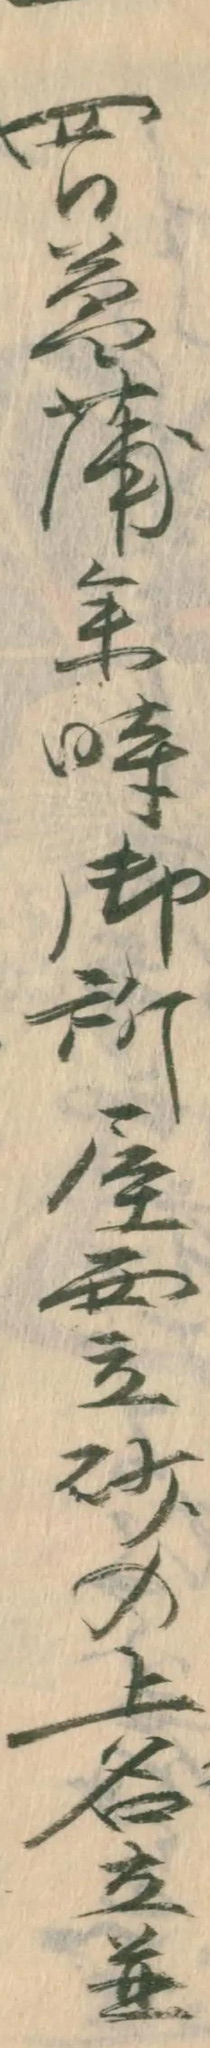一四日菖蒲参時御所屋西立砂の上名立並
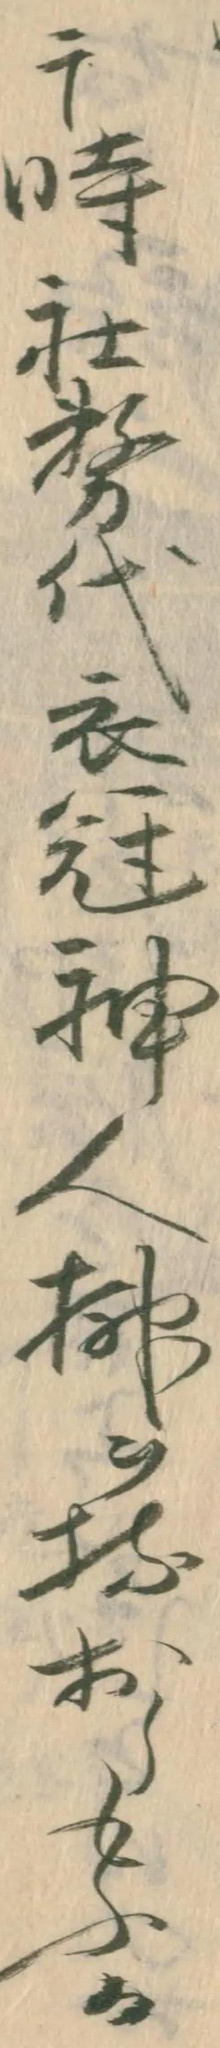于時社務代衣冠神人榊を持おらもふ而
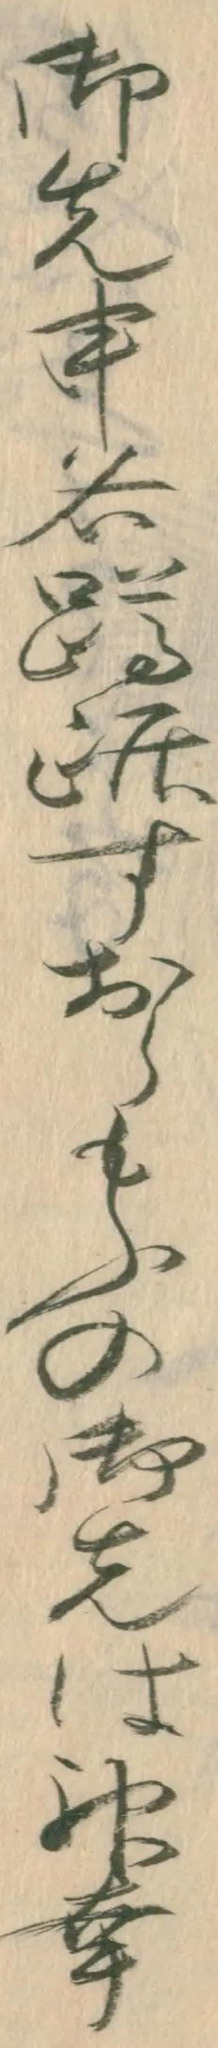御先申各蹲踞すおらもふの御先は神幸
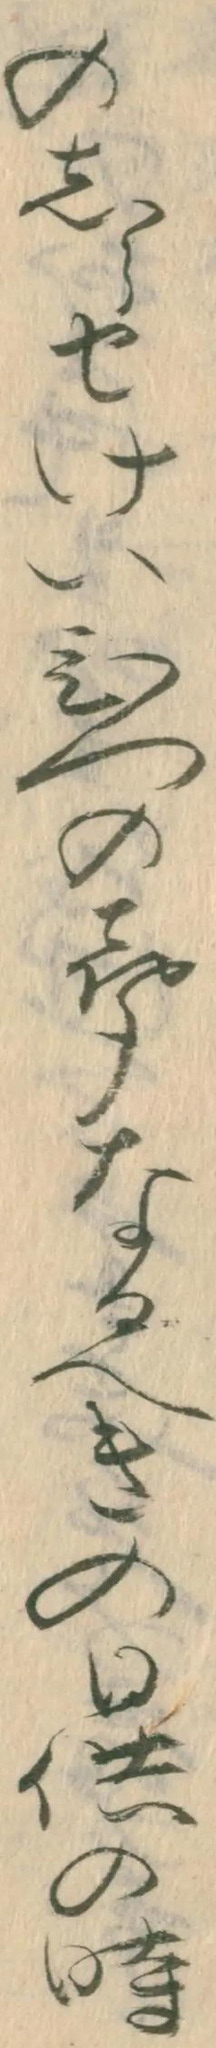のしらせけいひつの声なるへきの日供の時
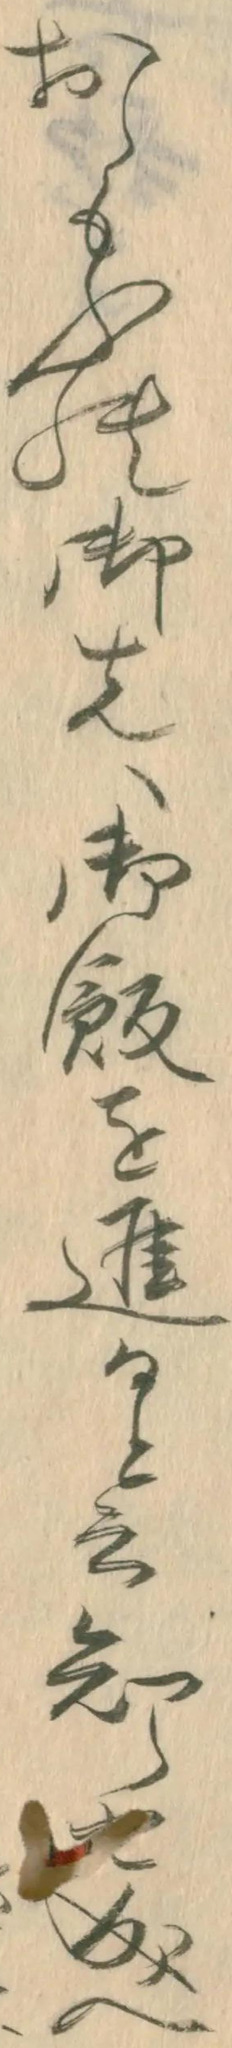おらもふの御先へ御飯を進ると云知らせ成へ
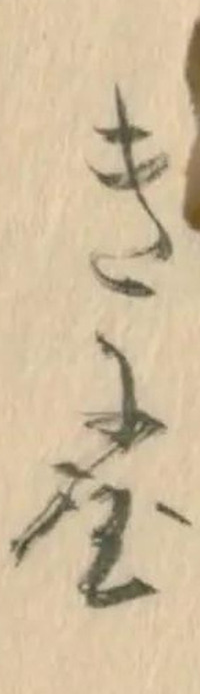きにや

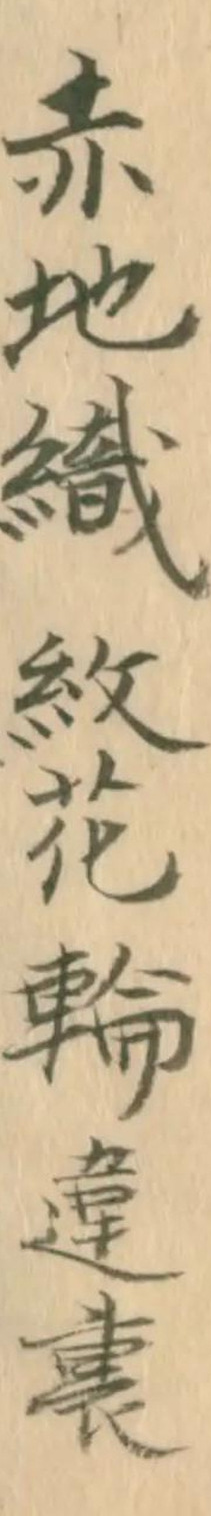赤地織紅花輪違裏
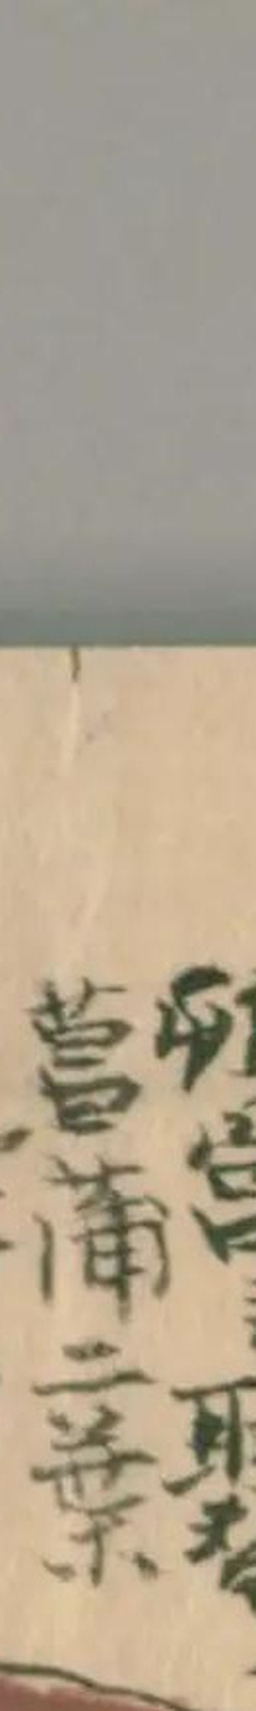菖蒲ニ葉
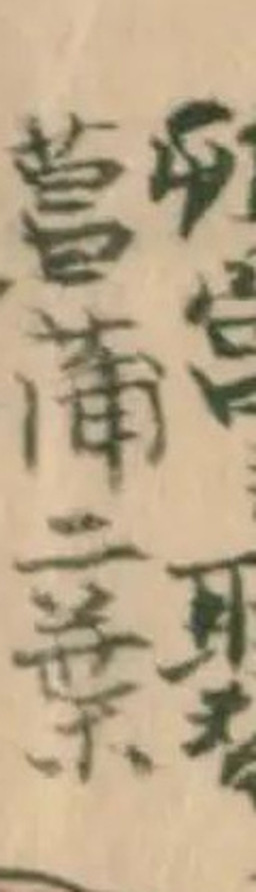菖蒲ニ葉
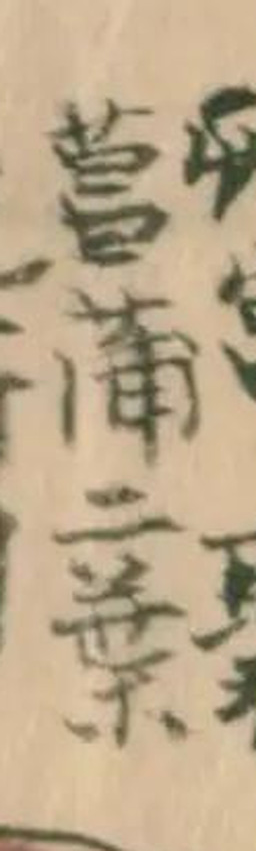菖蒲ニ葉
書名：賀茂社記録. 第12冊
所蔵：国立国会図書館 National Diet Library, JAPAN
